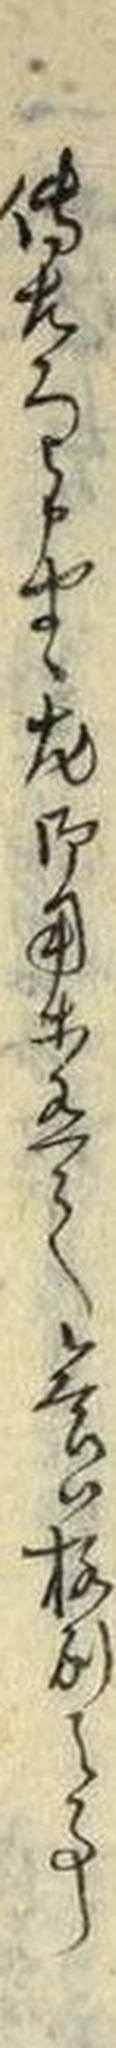伝左衛門被申聞候尤御用等有之候節ハ格別之事

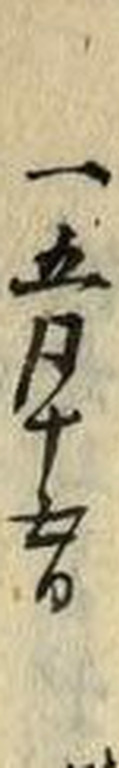一五月十五日
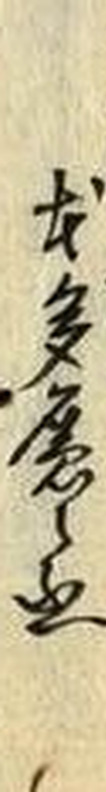本多廉之丞
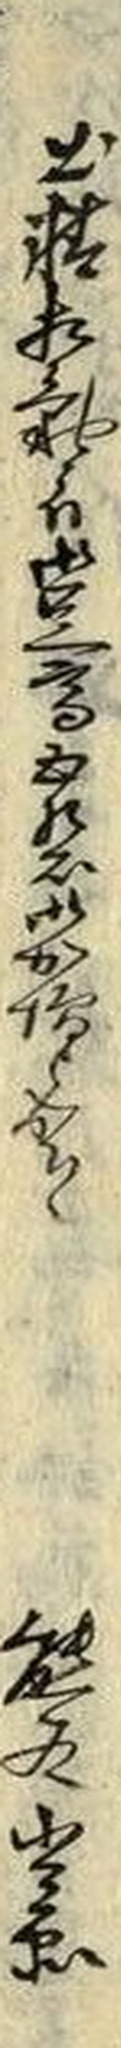出精相勤候ニ付御足高五拾石御加増被成下候熊谷小兵衛
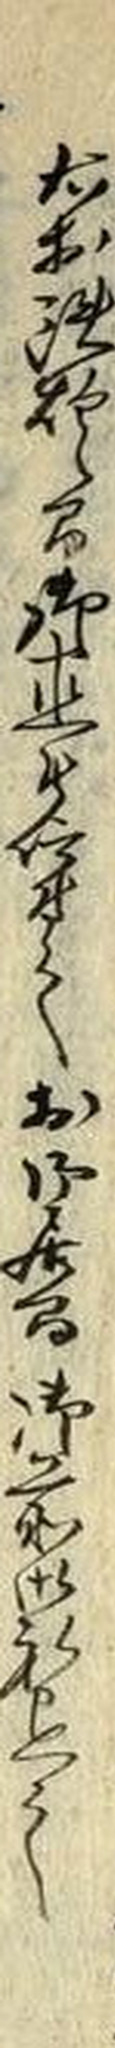右於鉄炮之間御直被仰付之於御居間御前御礼申上之
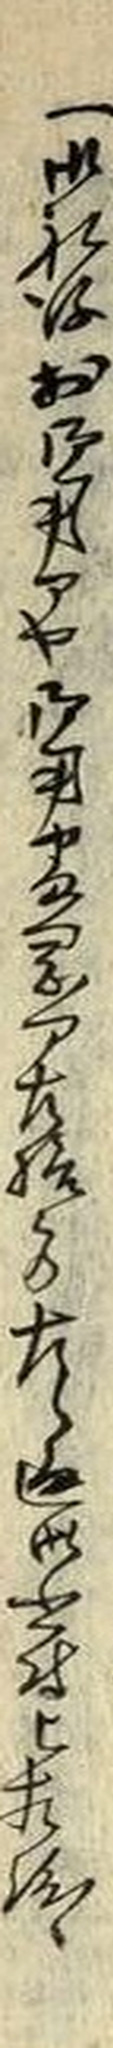一御礼後於御用部や御用番岡部左膳方左之通御書付被相渡候
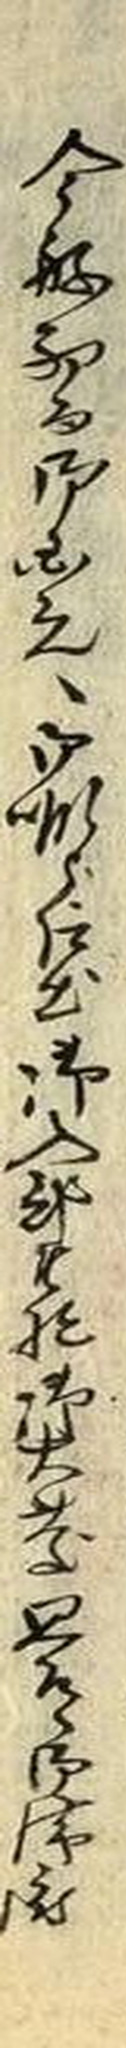今般初而御国元へ御暇被仰出御入部被遊御大慶思召候御滞府
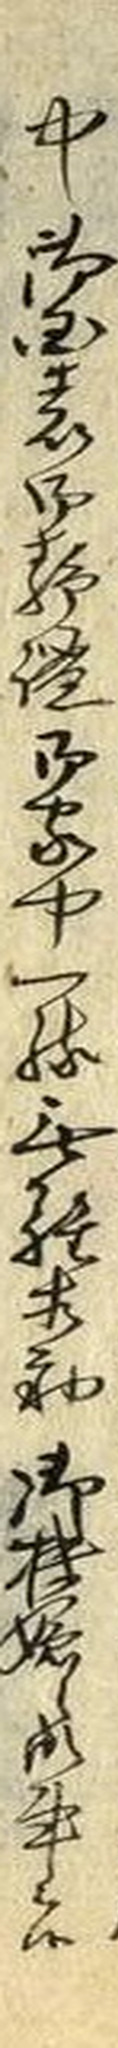中御国表御静謐御家中一統無難相勤御機嫌御事ニ候
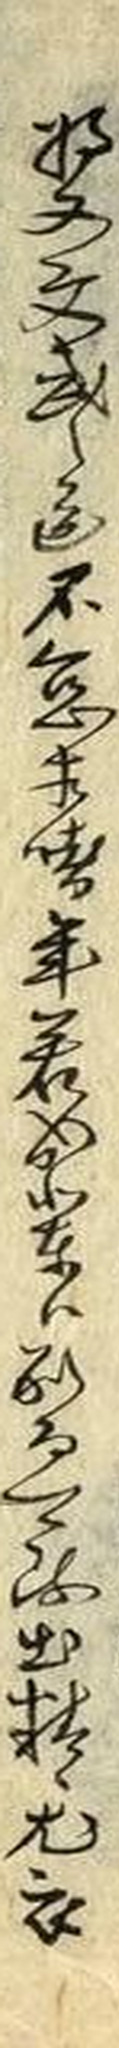扨又文武之道不怠相嗜年若成輩ハ別而可致出精候尤衣
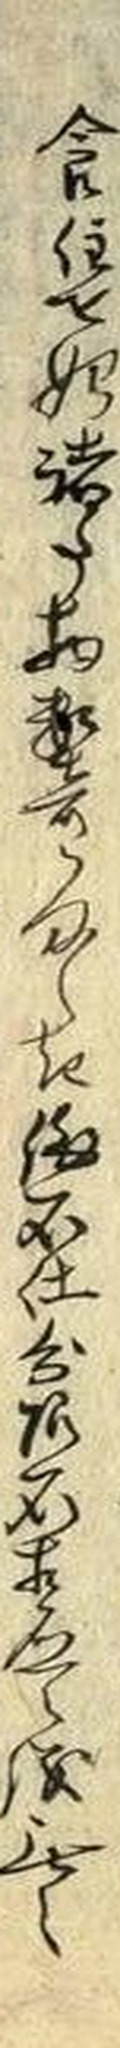食住を始諸事物数寄かましき儀不仕分限不相応之儀無之
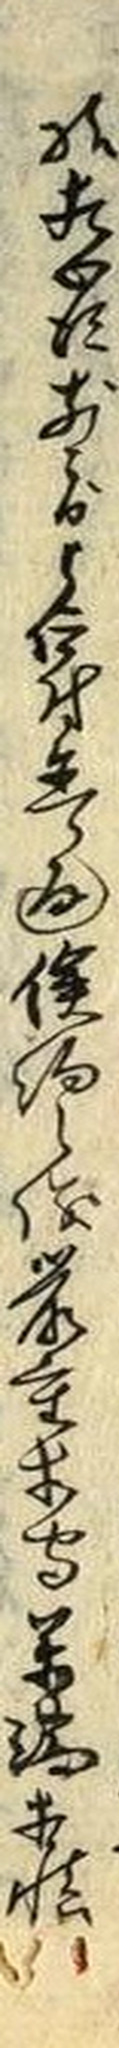様相心得前々ゟ被仰付置候通倹約之儀厳重相守万端相慎
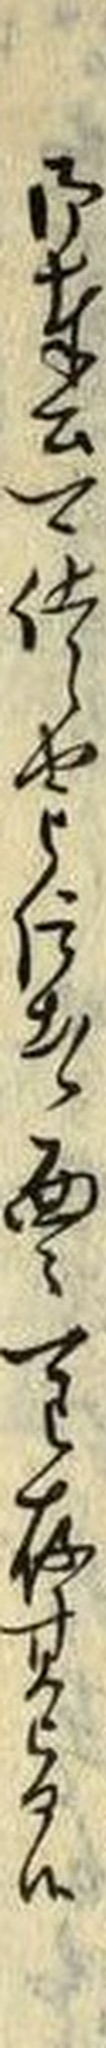御奉公可仕候由被仰出候面々可被存其旨候
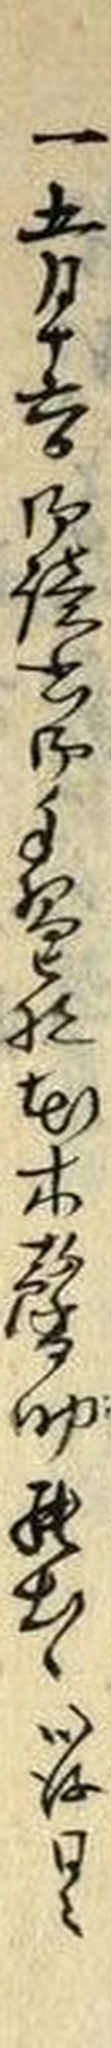一五月十六日御読書御手習被遊花木馨助罷出候以後日々
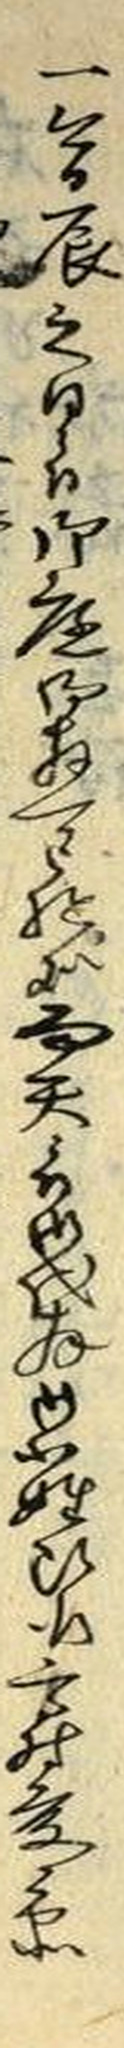一今日辰之日ニ付御庭御拝可被遊候処雨天ニ付御代拝御小姓頭取高村藤兵衛
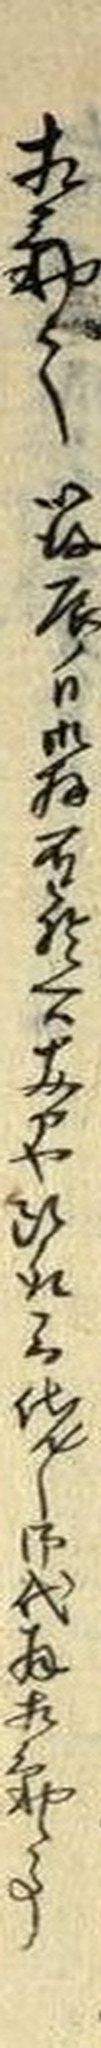相勤之以後辰之日御拝不被遊候へハ両部や頭取ニ而代ル〳〵御代拝相勤候事
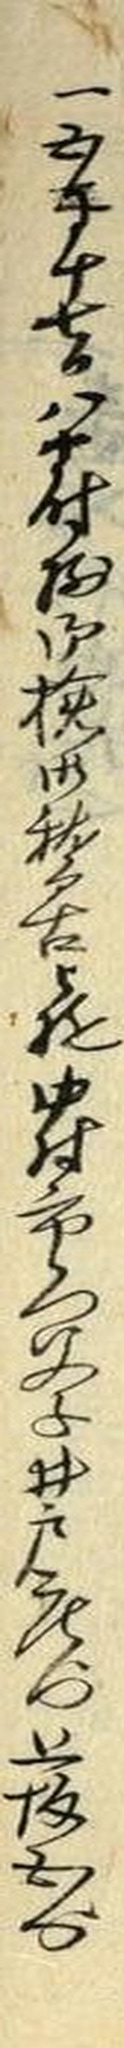一五月十七日八半時揃御槍御稽古被遊中村市右衛門父子井戸庄右衛門上坂五右衛門
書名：少傅日録抄（斉善付側向頭取日記、江戸并道中、初入在国、逝去後…
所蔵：福井県文書館 Fukui Prefectural Archives
